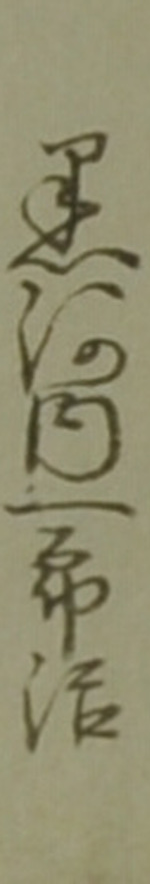黒河内一郎治
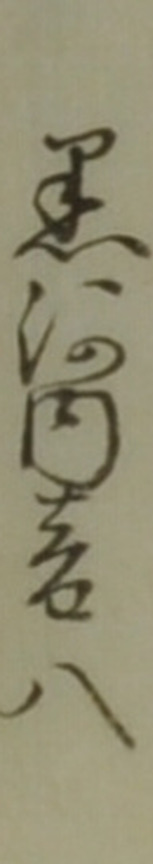黒河内音八
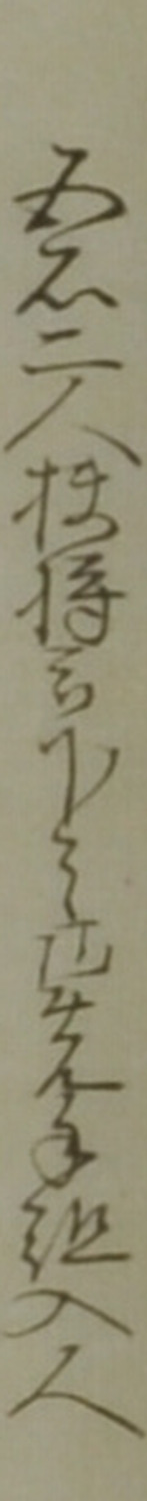五石二人扶持被下之御先手組入人
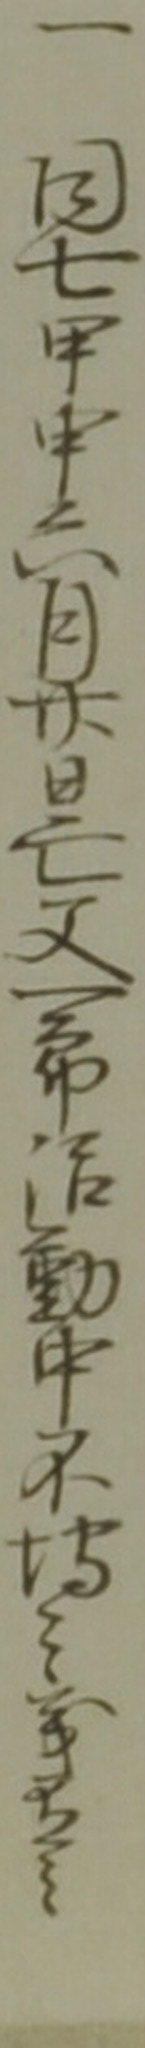一同七甲申六月廿日亡父一郎治勤中不埒之義有之
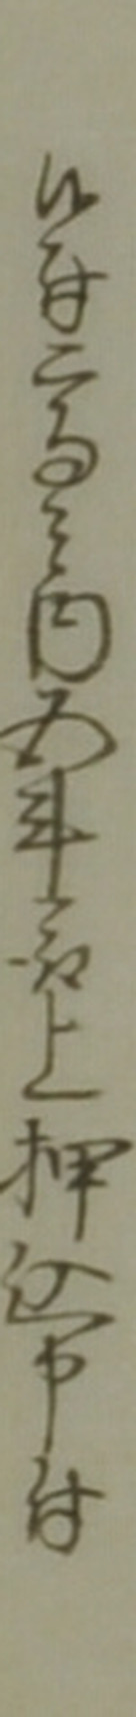候付高之内五斗取上押込申付
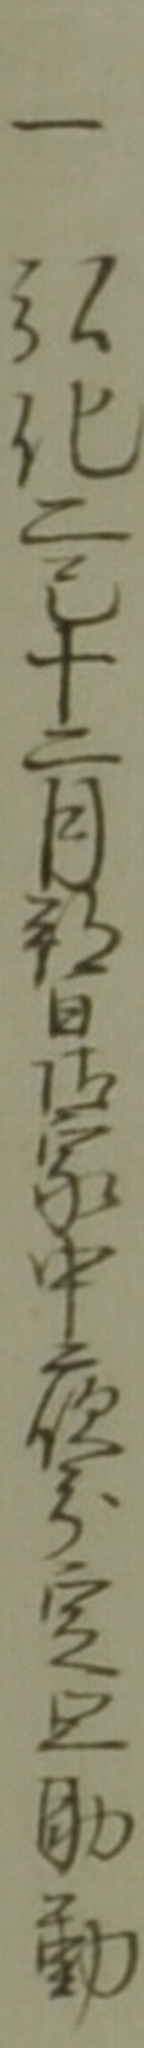一弘化二巳十二月朔日御家中夜分定廻助勤

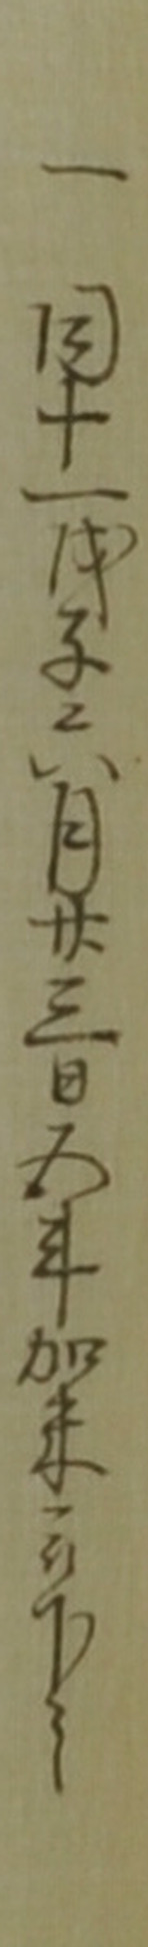一同十一戊子六月廿三日五斗加米被下之
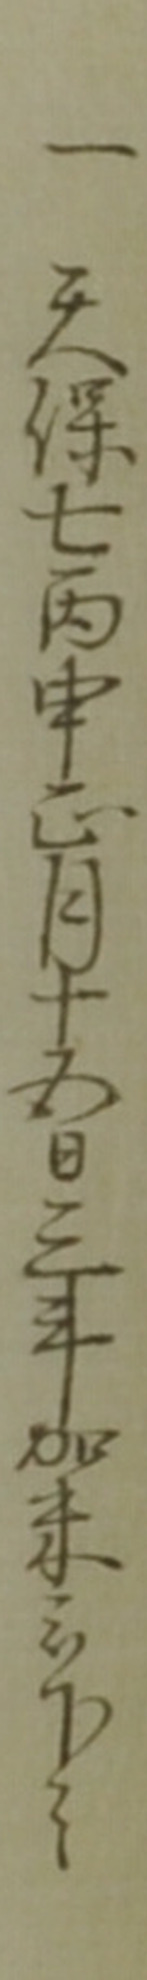一天保七丙申正月十五日三斗加米被下之
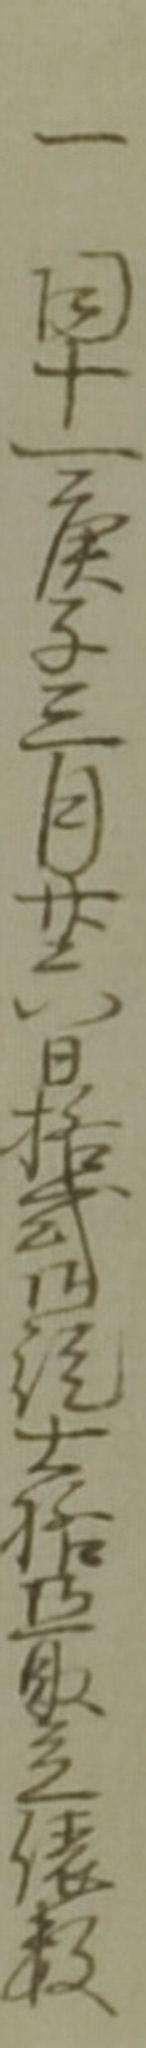一同十一庚子三月廿六日格式御徒士格御取立俵数

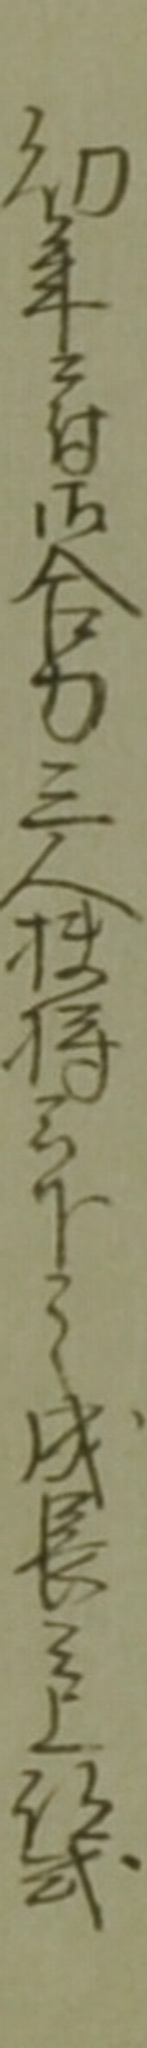幼年ニ付御合力三人扶持被下之成長之上跡式
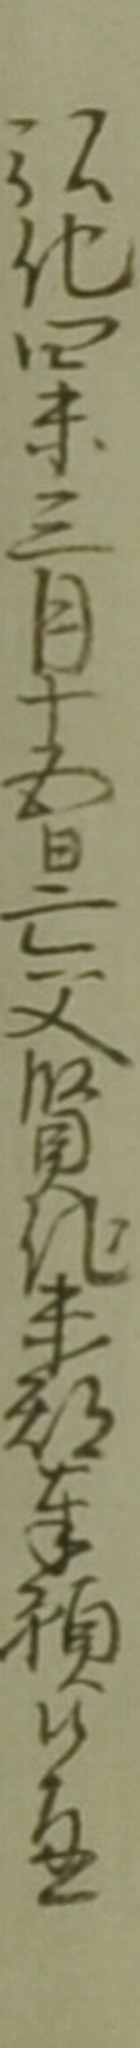一弘化四未三月十五日亡父賢作末期奉預候通
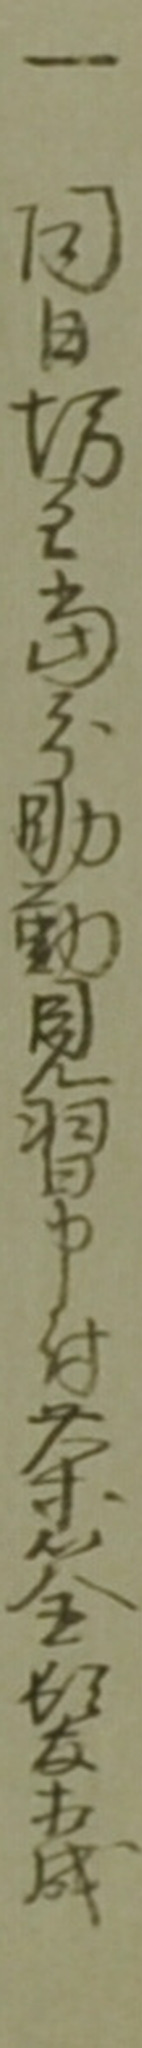一同日坊主当分助勤見習申付茶筌髪相成
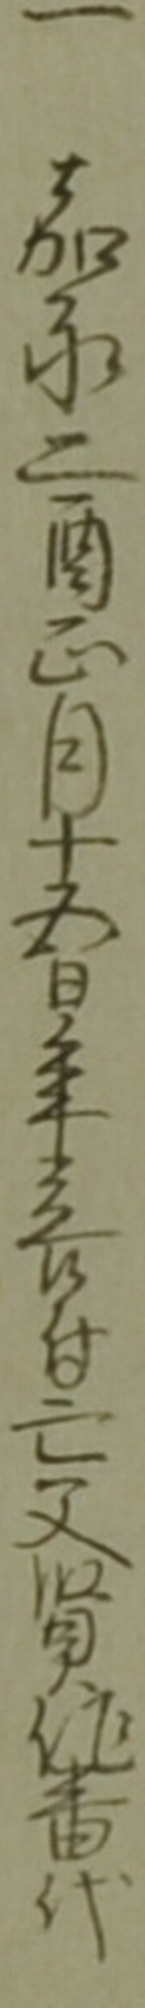一嘉永二酉正月十五日年立候付亡父賢作番代
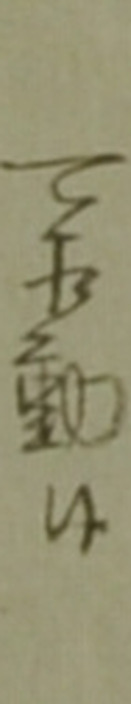可相勤候
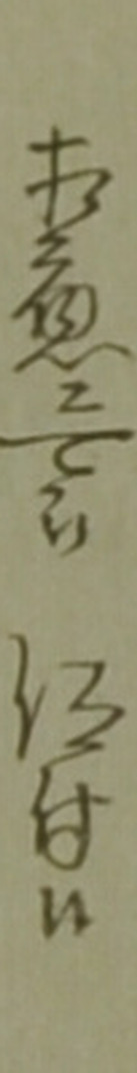相応ニ可被仰付候
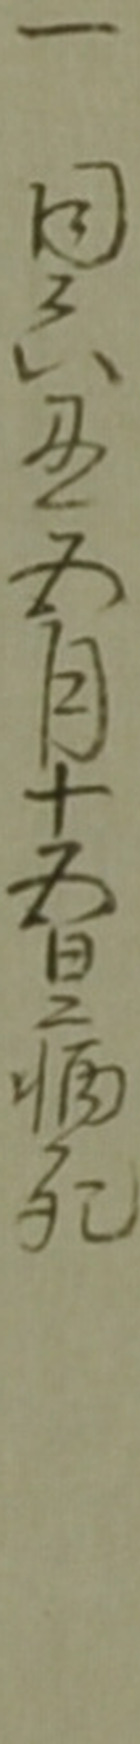一同六丑五月十五日病死
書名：無足諸士勤仕録（九）
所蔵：伊那市立高遠町図書館・合同会社AMANE
